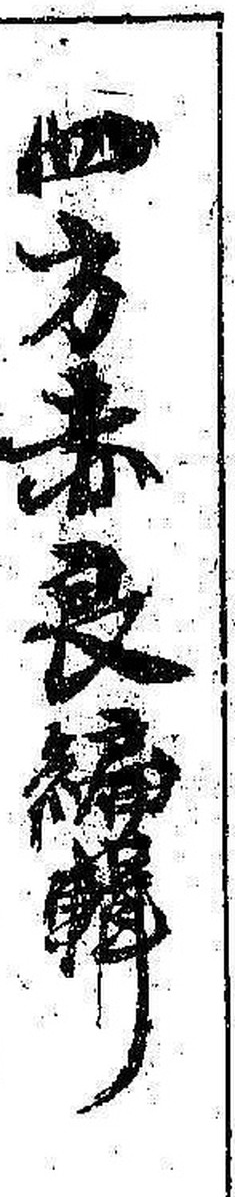四方赤良編輯
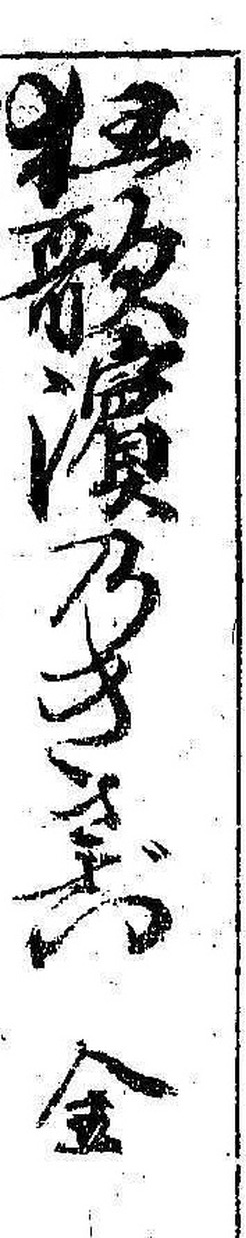狂歌浜のきさご全
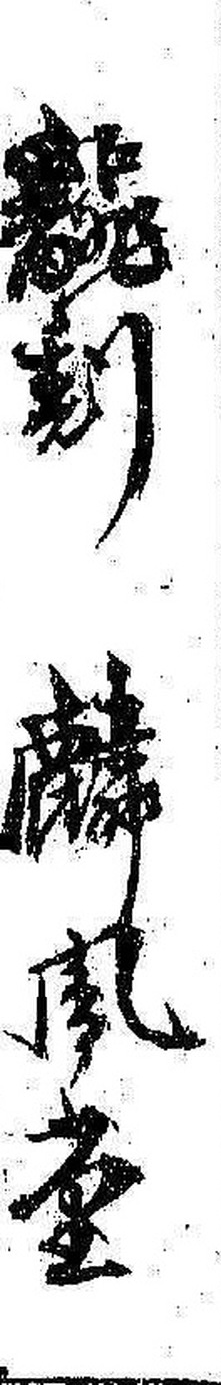翻刻麟風堂
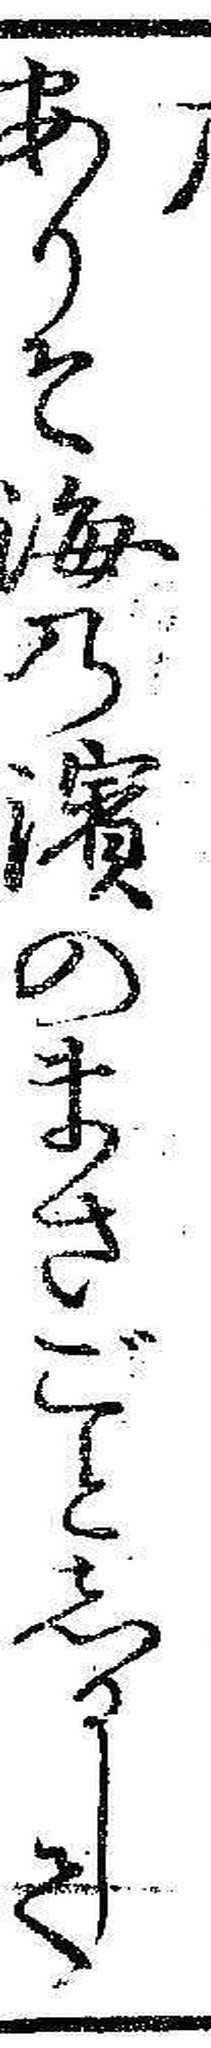ありそ海の浜のまさごとしるして
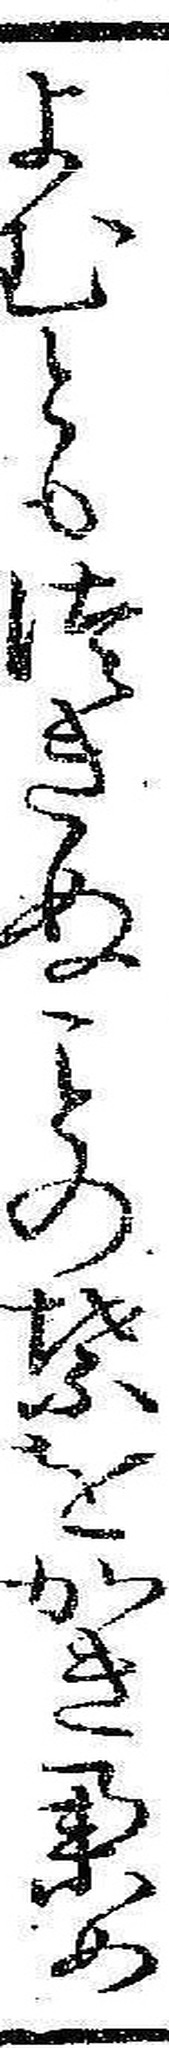よむともつきぬことの葉をかき集め
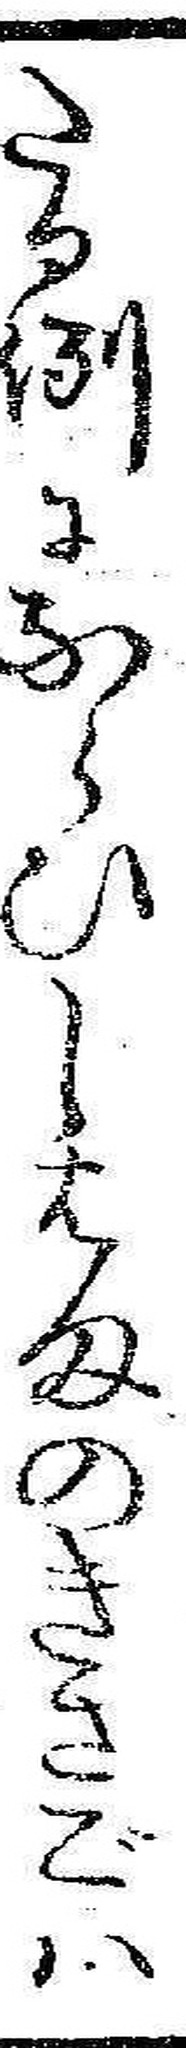たる例にならひしはまのきさごは
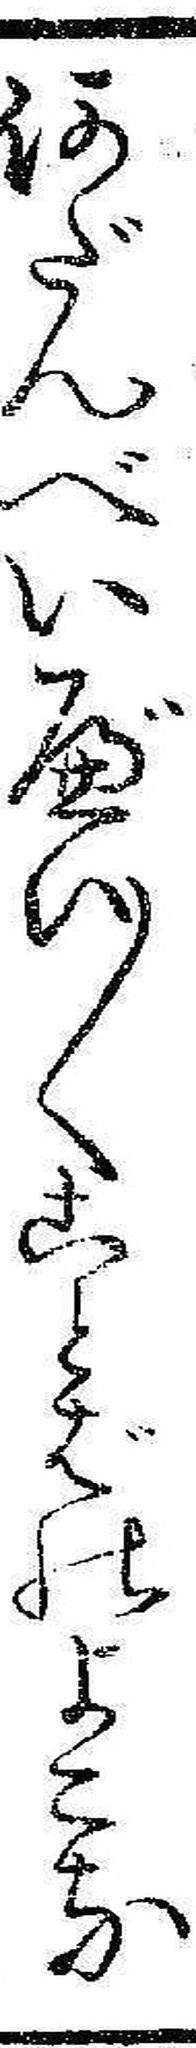何だんべいべい〳〵ことばのよこな
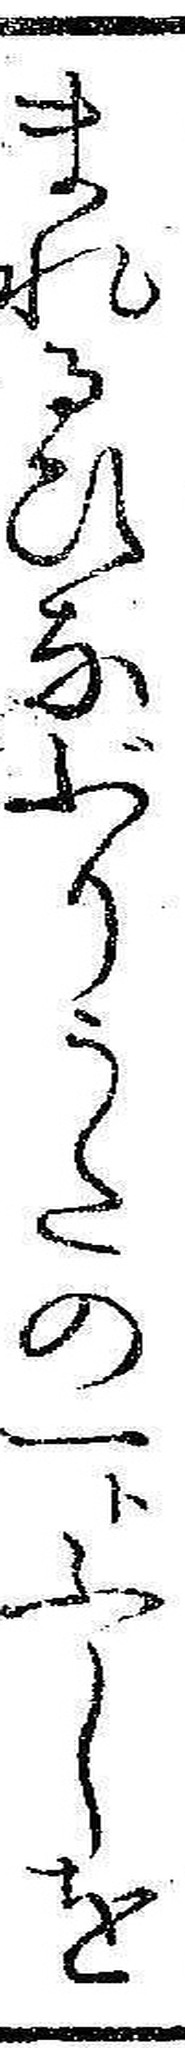まれるひなぶりうたの一とふしを
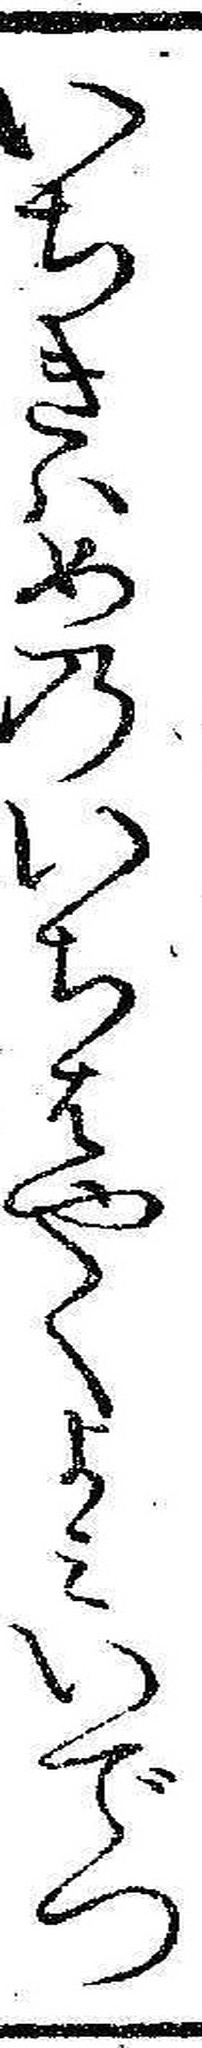いちきはめのいちはやくよみいでつ

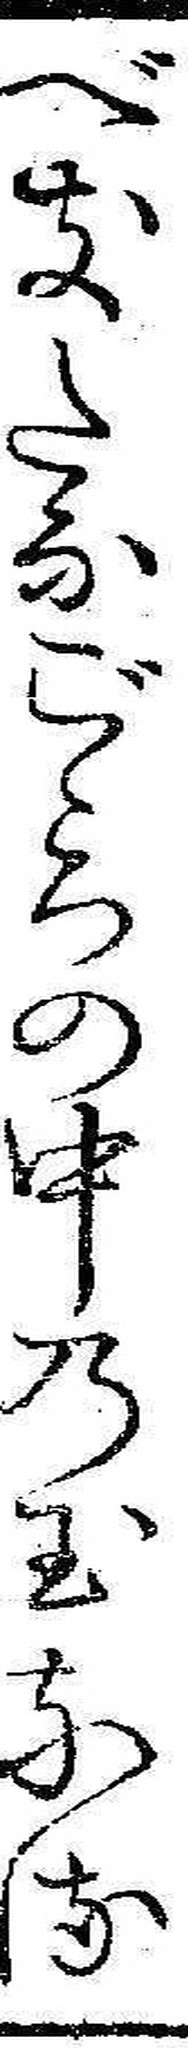べきたなごゝろの中の玉なる
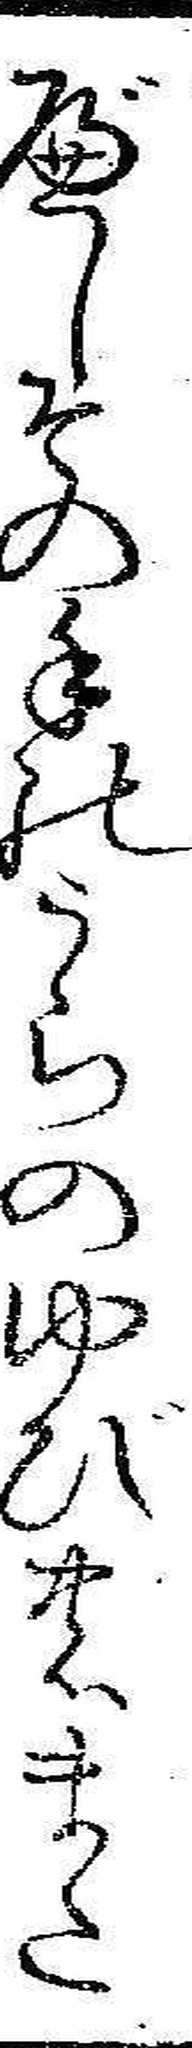べしその手のうらのゆびのまた
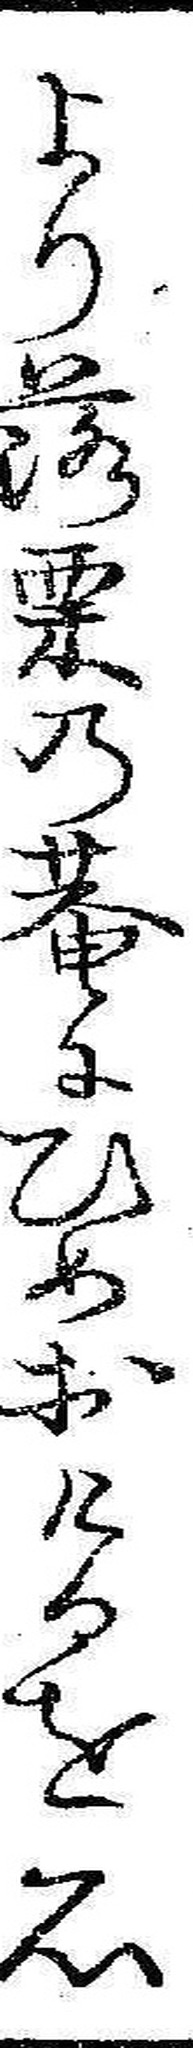より落栗の庵にひめおけるを石
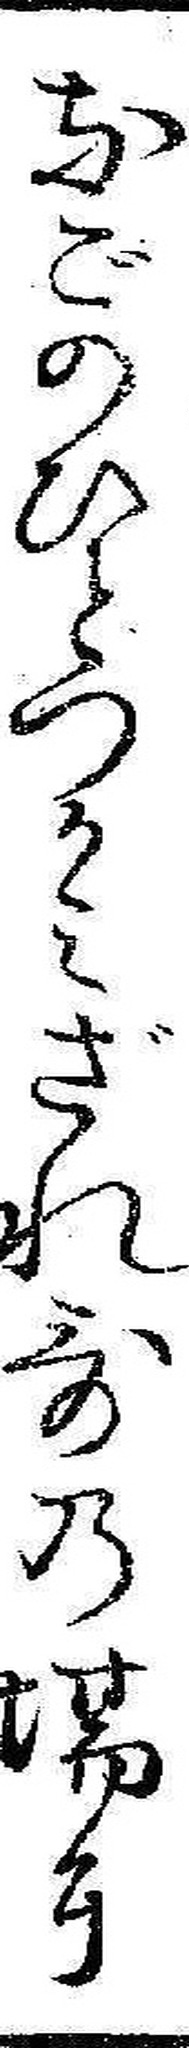なごのひとつかみざれ歌の場に
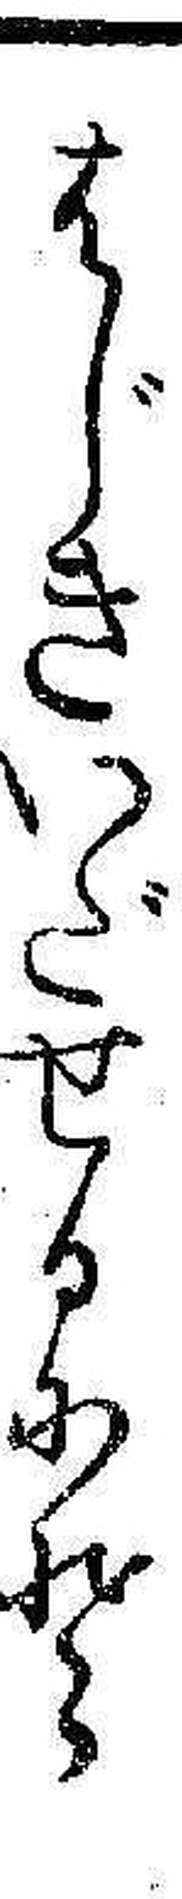はじきいだせるにそ
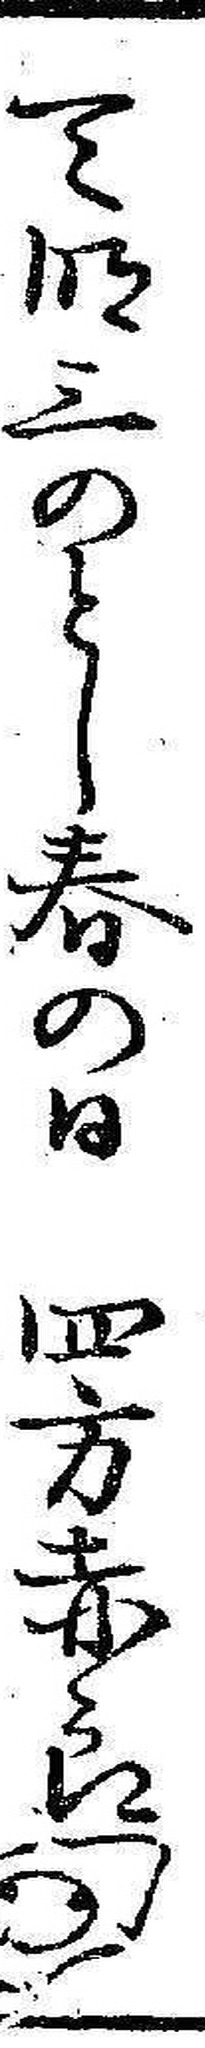天明三のとし春の日四方赤良花押
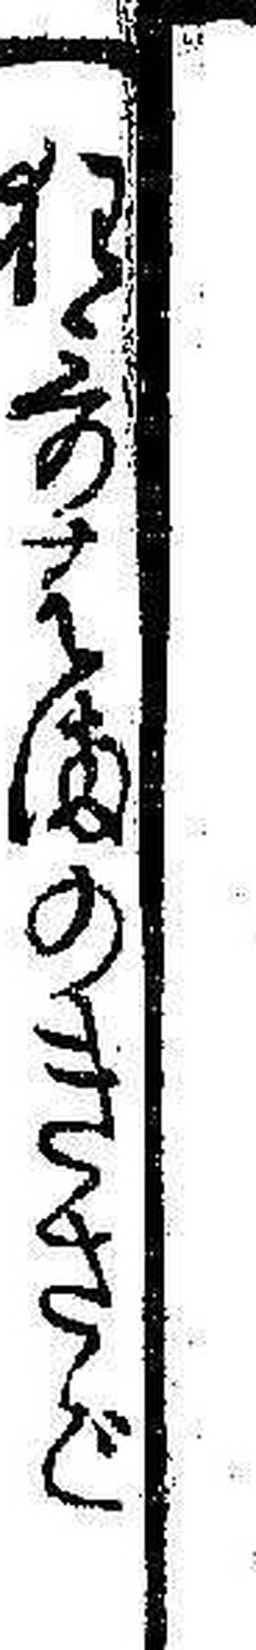狂歌はまのきさご
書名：狂哥はまのきさご
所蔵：国文学研究資料館
